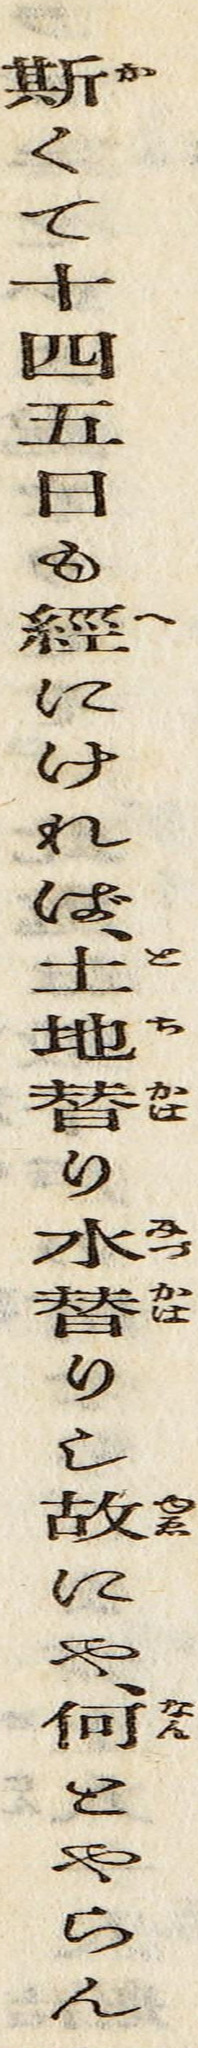斯くて十四五日も経にければ、土地替り水替りし故にや、何とやらん
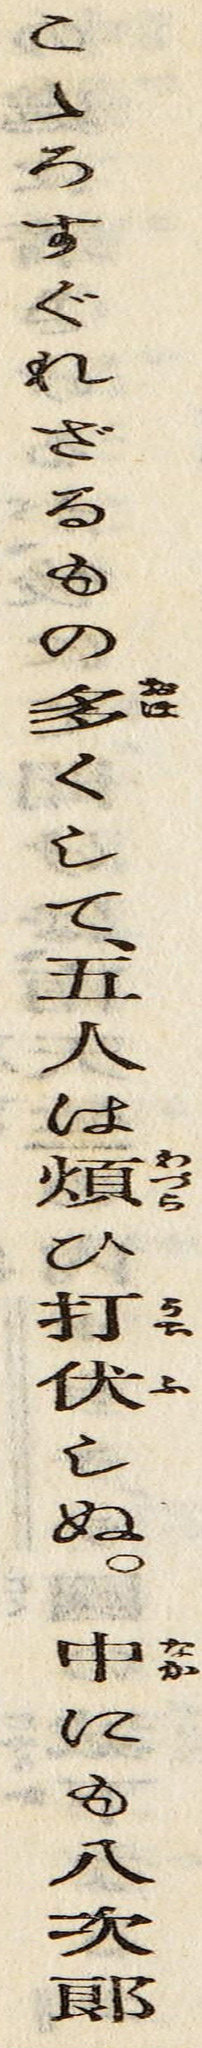こゝろすぐれざるもの多くして、五人は煩ひ打伏しぬ。中にも八次郎
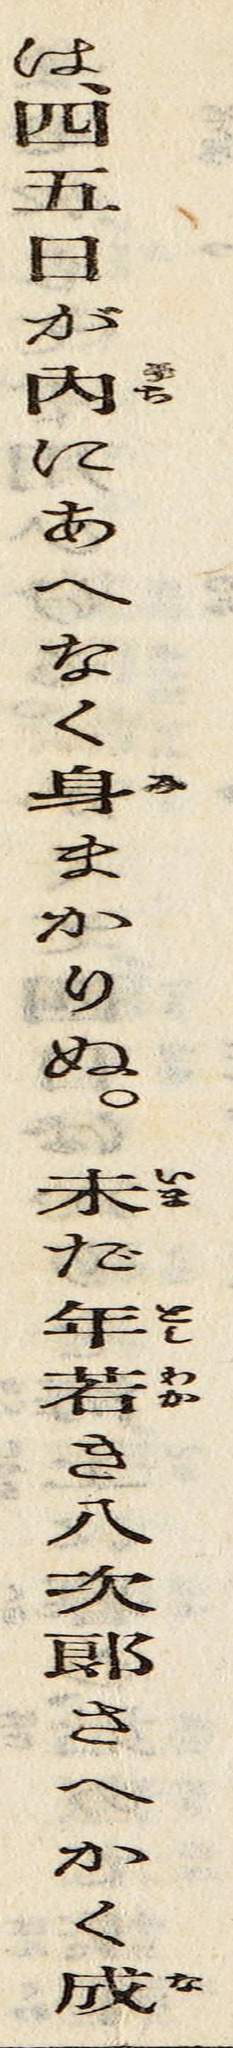は、四五日が内にあへなく身まかりぬ。未だ年若き八次郎さへかく成
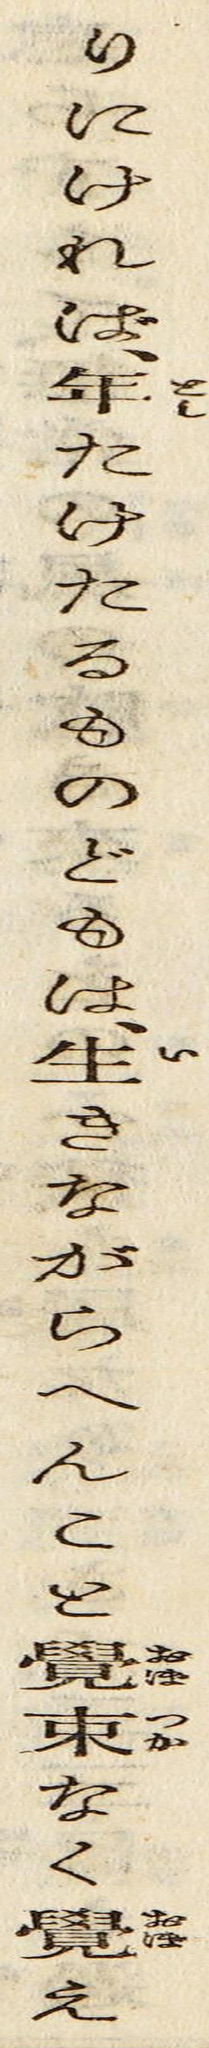りにければ、年たけたるものどもは、生きながらへんこと覚束なく覚え
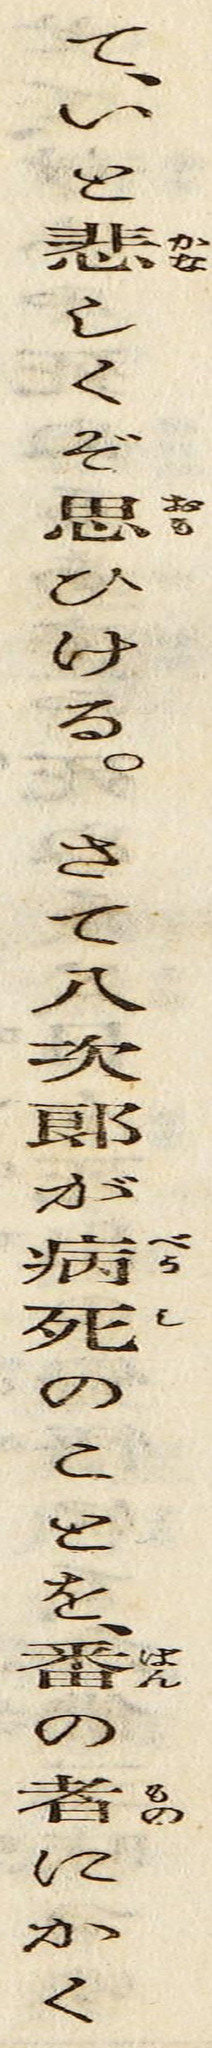て、いと悲しくぞ思ひける。さて八次郎が病死のことを、番の者にかく
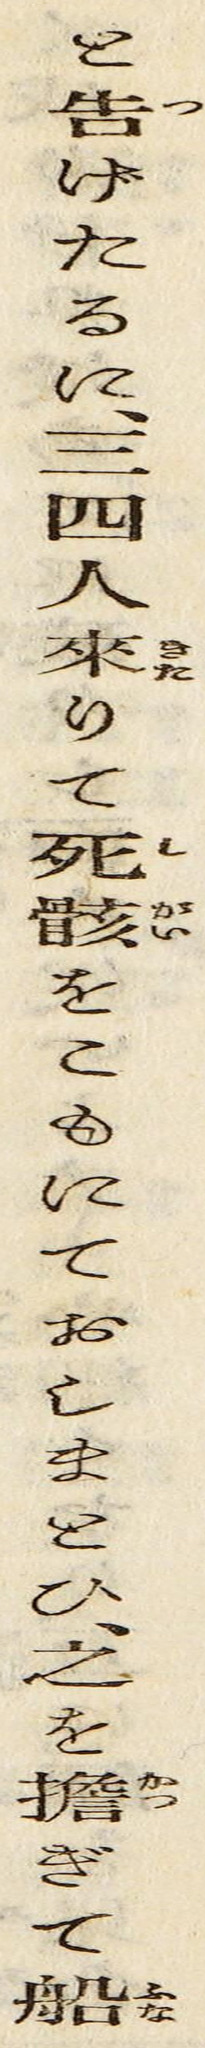と告げたるに、三四人来りて死骸をこもにておしまとひ、之を担ぎて船
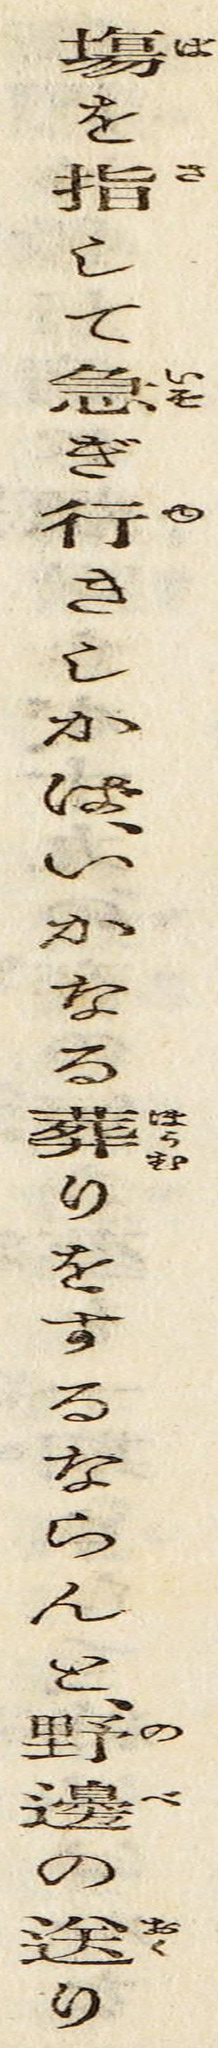場を指して急ぎ行きしかば、いかなる葬りをするならんと、野辺の送り
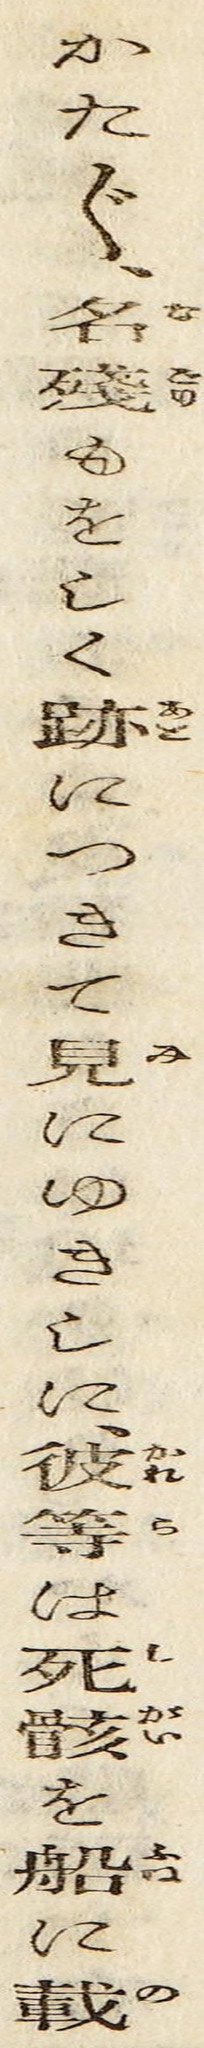かた〴〵、名残もをしく跡につきて見にゆきしに、彼等は死骸を船に載
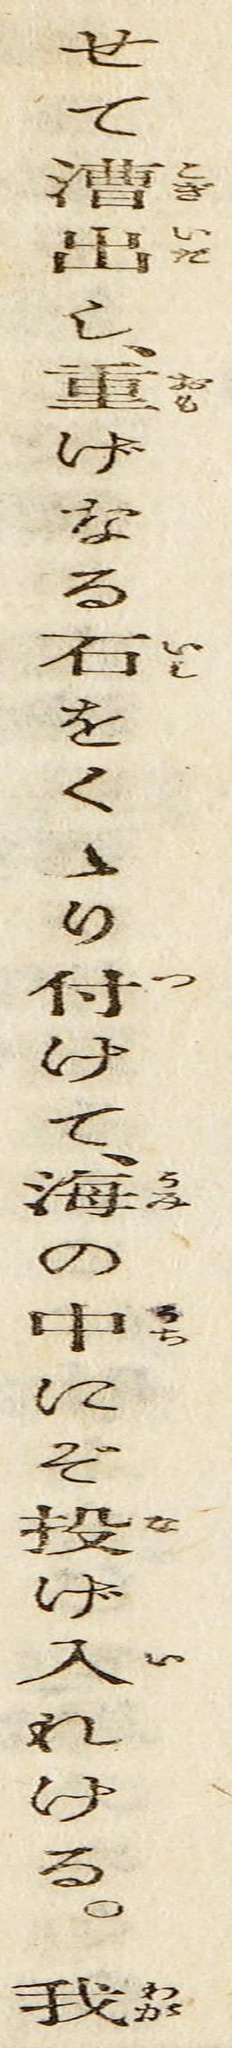せて漕出し、重げなる石をくゝり付けて、海の中にぞ投げ入れける。我
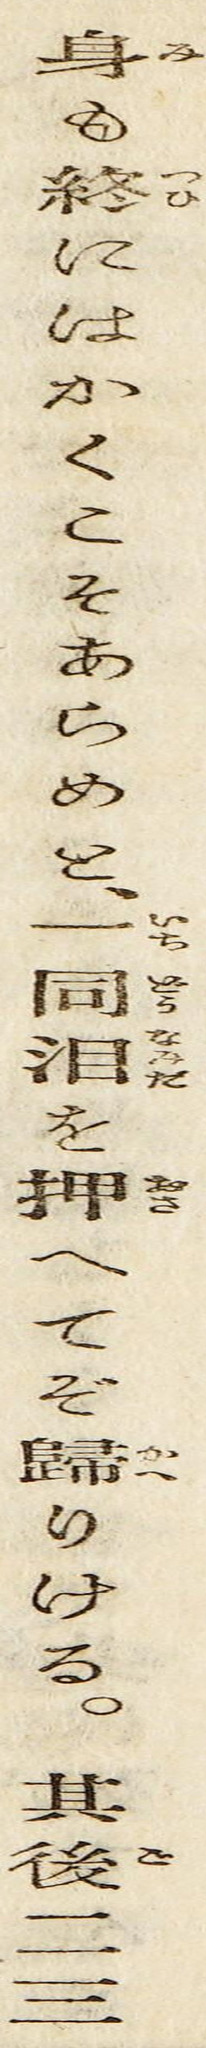身も終にはかくこそあらめと、一同泪を押へてぞ帰りける。其後二三
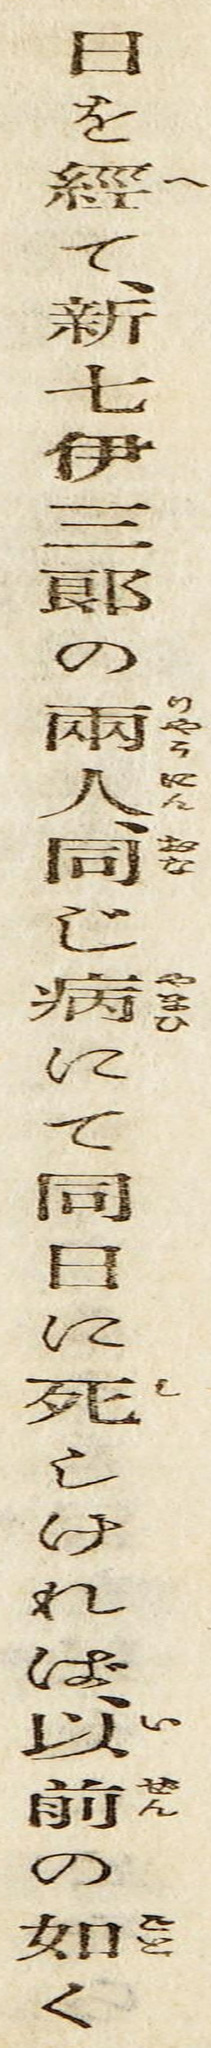日を経て、新七伊三郎の両人、同じ病にて同日に死しければ、以前の如く
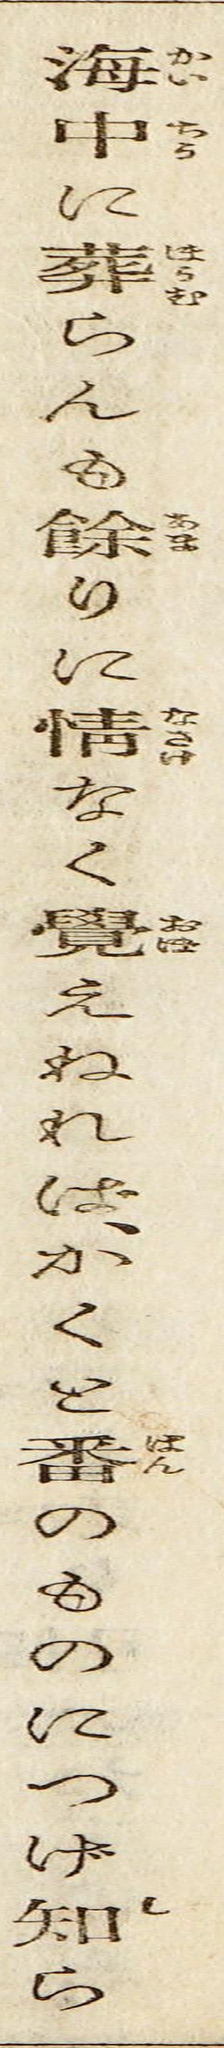海中に葬らんも余りに情なく覚えぬれば、かくと番のものにつげ知ら
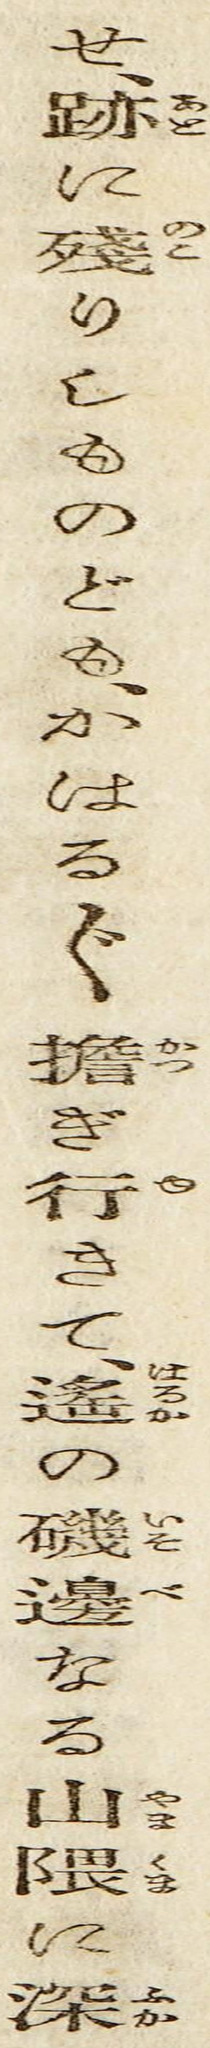せ、跡に残りしものども、かはる〴〵担ぎ行きて、遥の磯辺なる山隈に深
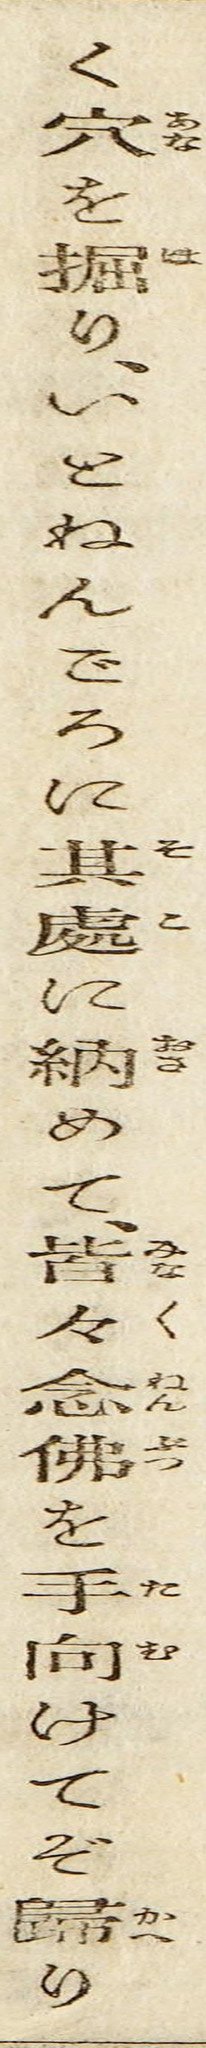く穴を掘り、いとねんごろに其処に納めて、皆々念仏を手向けてぞ帰り
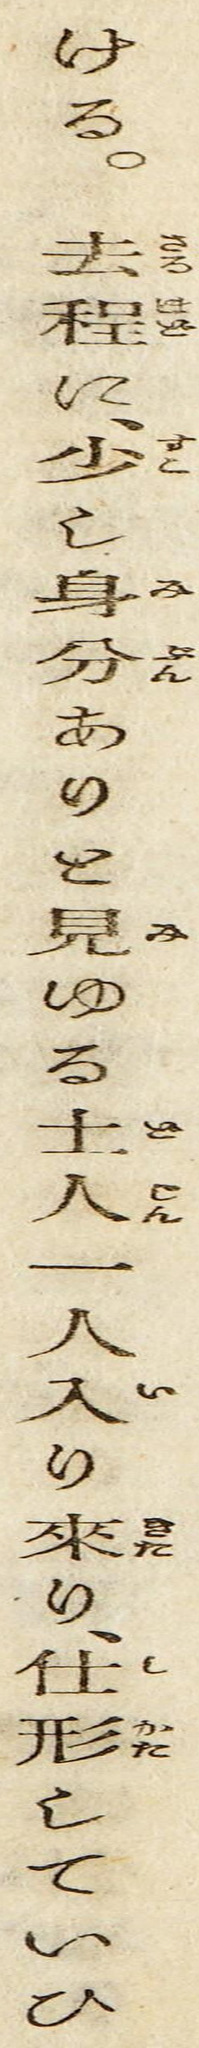ける。去程に、少し身分ありと見ゆる土人一人入り来り、仕形していひ

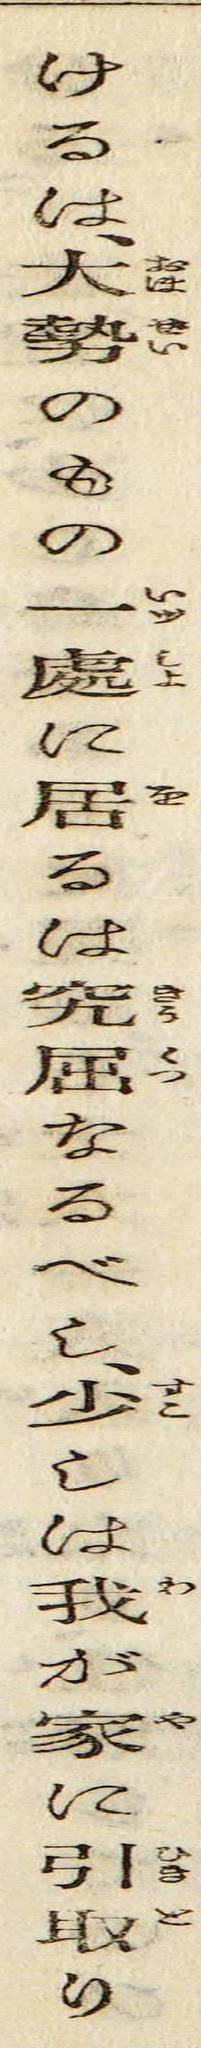けるは、大勢のもの一処に居るは究屈なるべし、少しは我が家に引取り
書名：日本漂流譚
